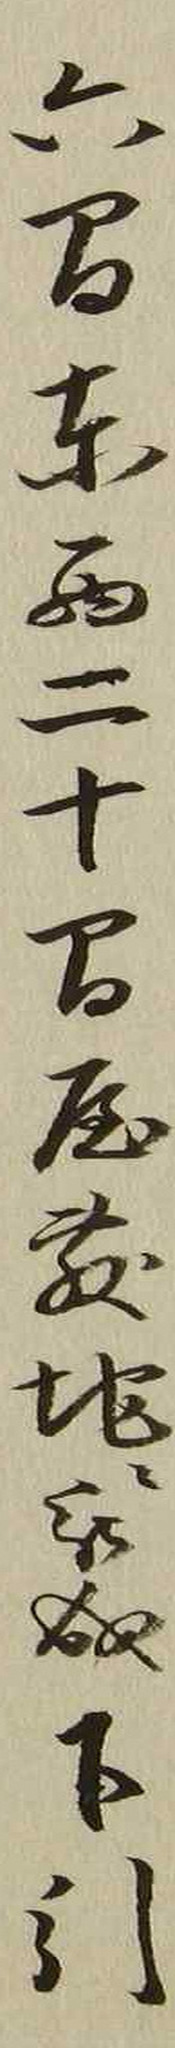六間東西二十間屋敷地ニ被成下引
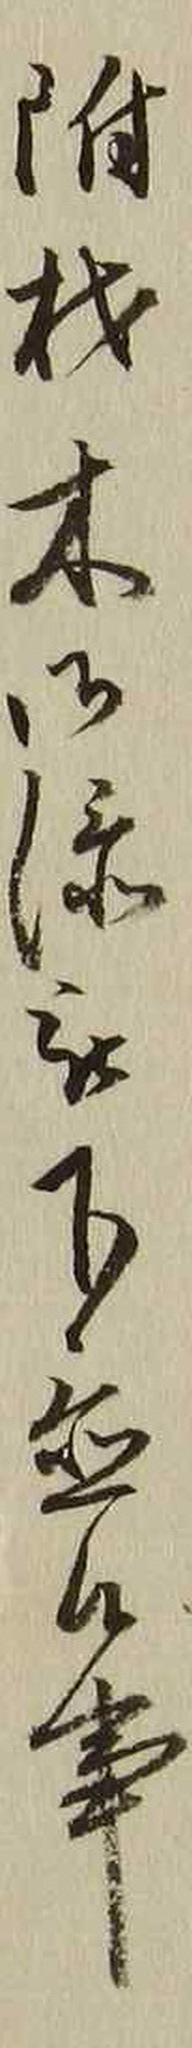附材木御添被下置候事
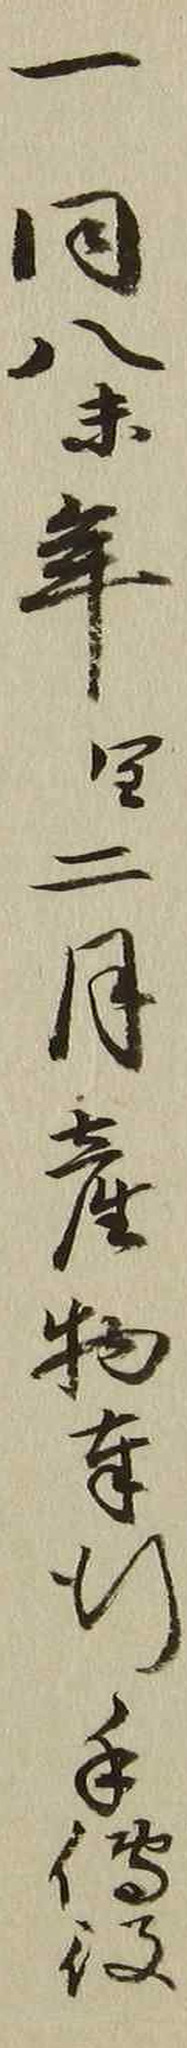一同八未年閏二月産物奉行手伝役
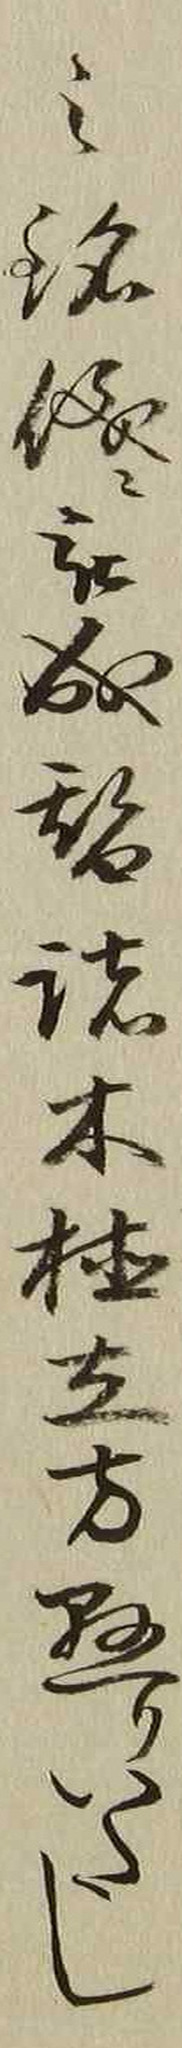之銘儀ニ被成替諸木植立方懸りいたし
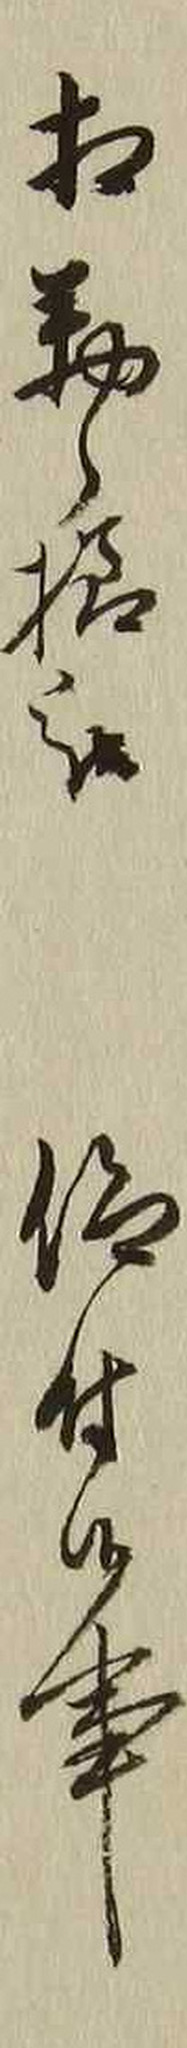相勤様被仰付候事
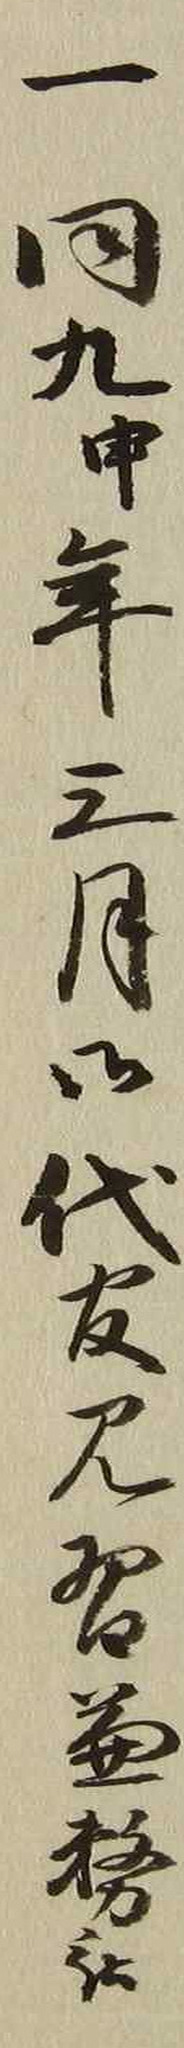一同九申年三月御代官見習兼務被
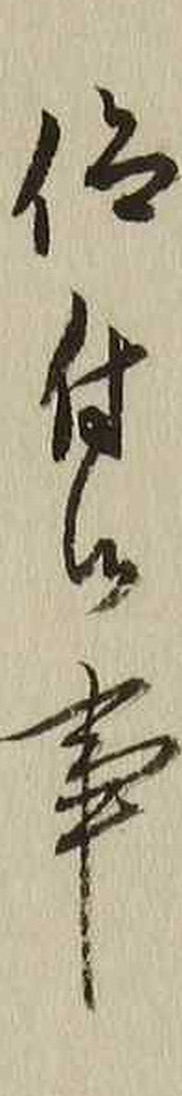仰付候事
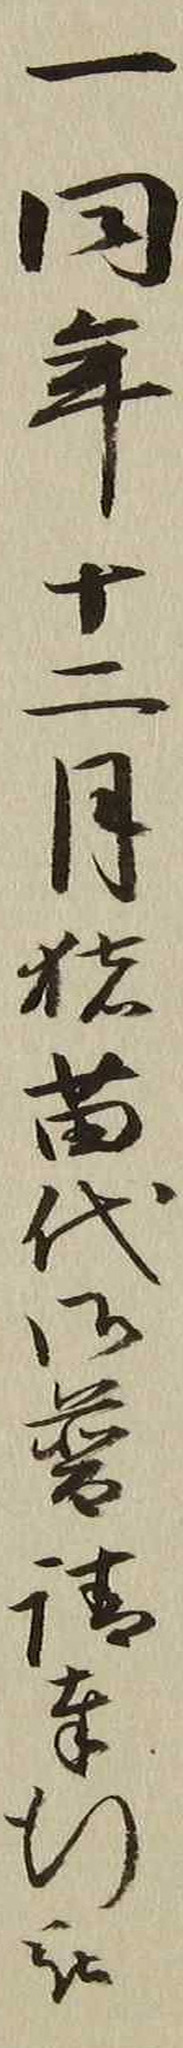一同年十二月猪苗代普請奉行被
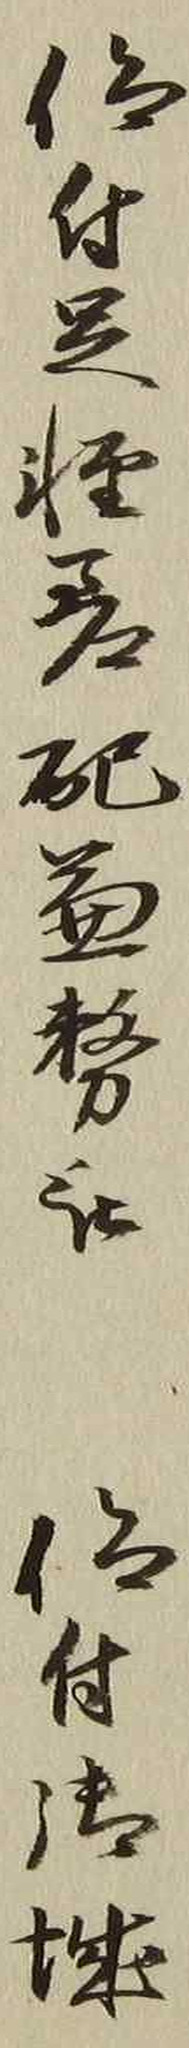仰付足軽差配兼務被仰付御城
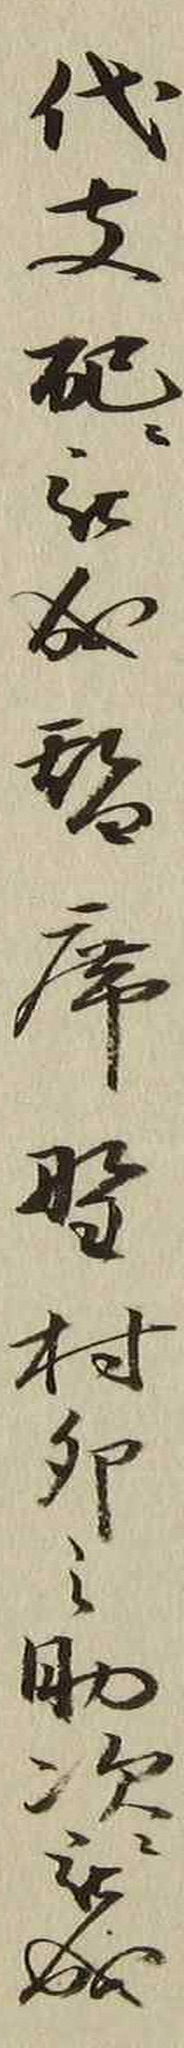代支配ニ被成替席野村外之助次ニ被成
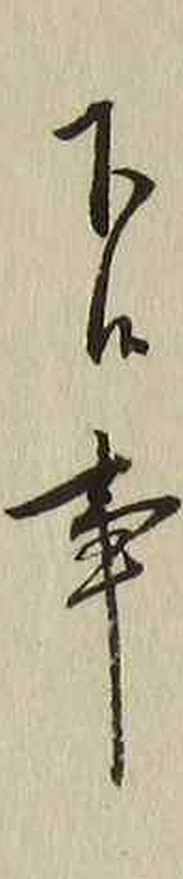下候事
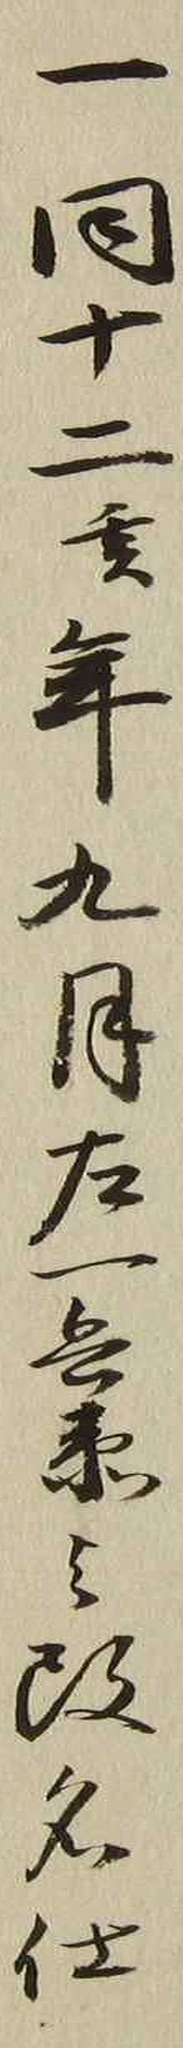一同十二亥年九月左一兵衛改名仕
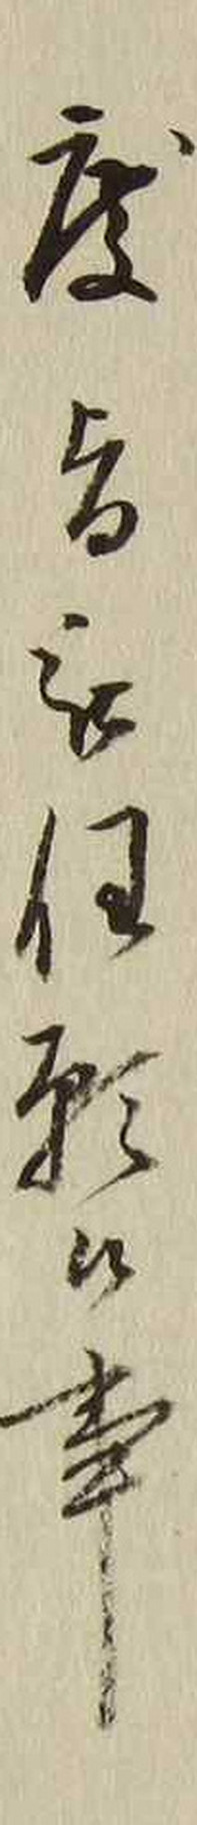度旨被任願候事
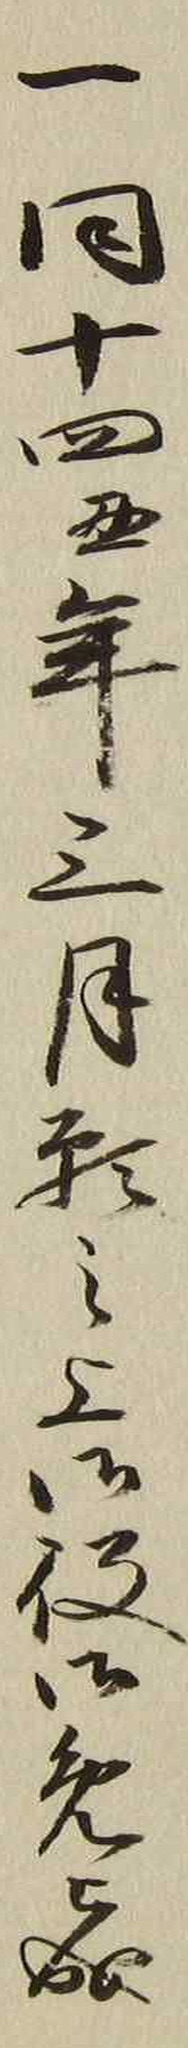一同十四丑年三月願之上御役御免被成
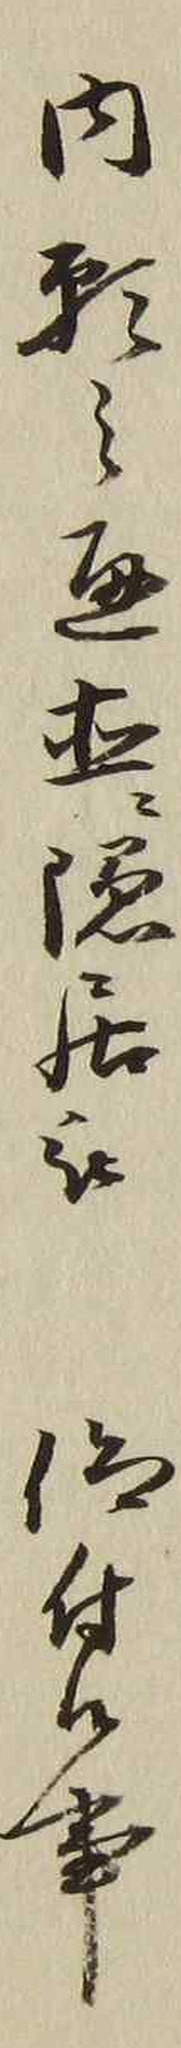内願之通直ニ隠居被仰付候事
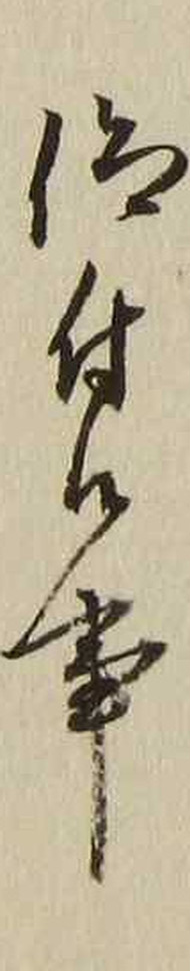仰付候事
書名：諸士系譜　巻之61　と之部4
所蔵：会津若松市立会津図書館
